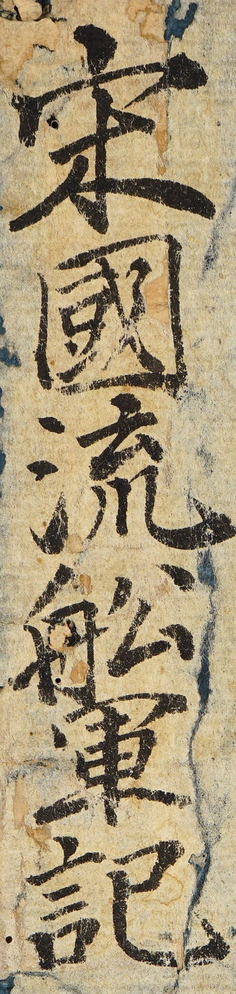宋國流船軍記
